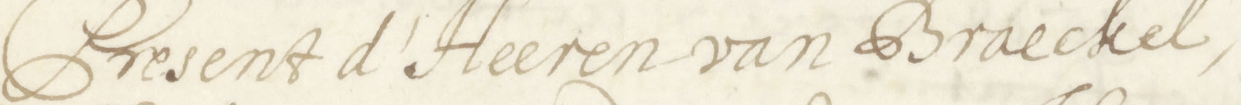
Present d'Heeren van Braeckel,
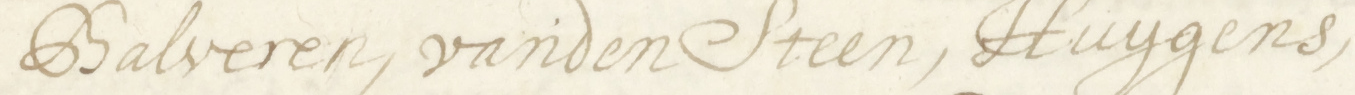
Balveren, vanden Steen, Huygens,
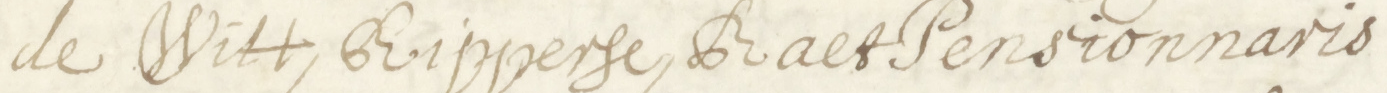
de Witt, Ripperse, Raet Pensionnaris
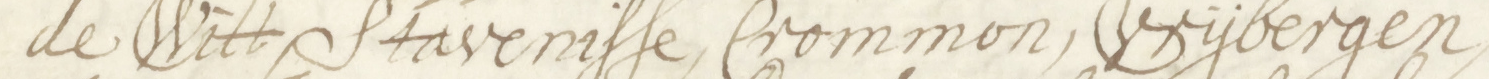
de Witt, Stavenisse, Crommon, Vrijbergen,
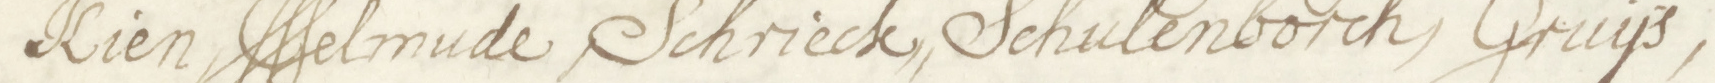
Kien, Isselmude, Schrieck, Schulenborch, Gruijs.
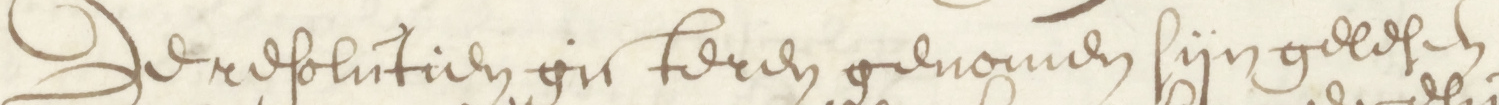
De resolutien gisteren genomen sijn gelesen
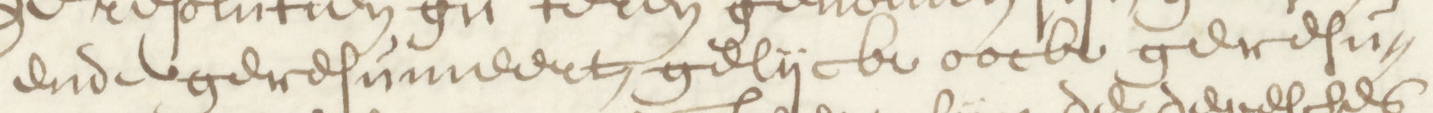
ende geresumeert, gelijck oock geresu„
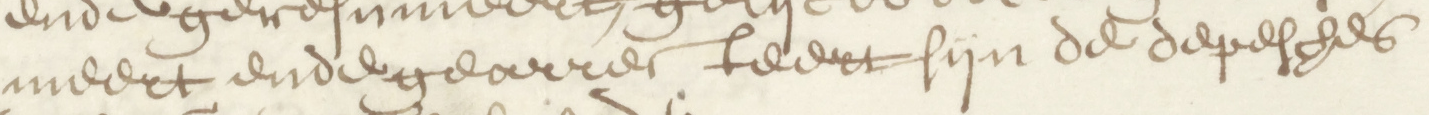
meert ende gearresteert sijn de depesches
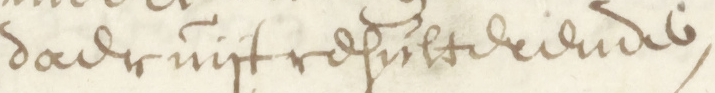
daeruijt resulterende,
